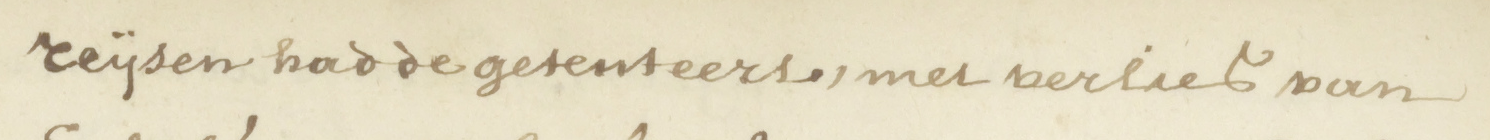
reijsen hadde getenteert, met verlies van
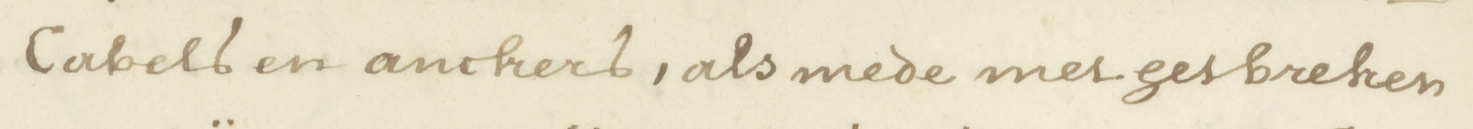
Cabels en anckers, als mede met het breken
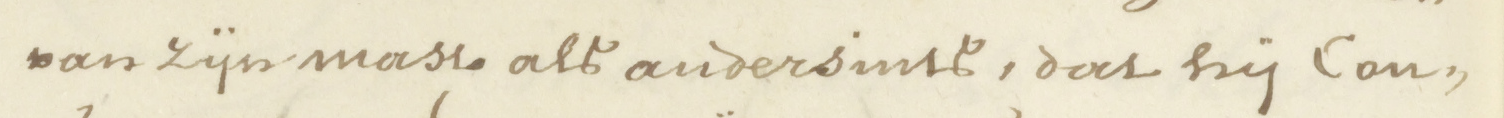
van zijn mast als andersints, dat hij Con„
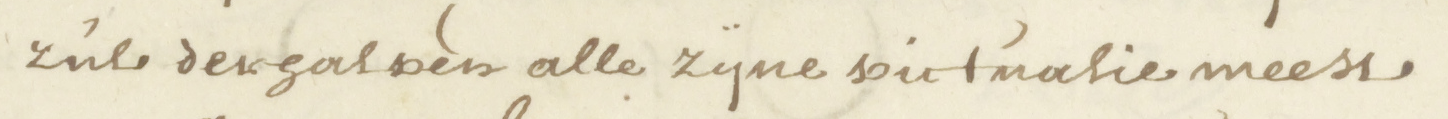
zul derhalven alle zijne victualie meest
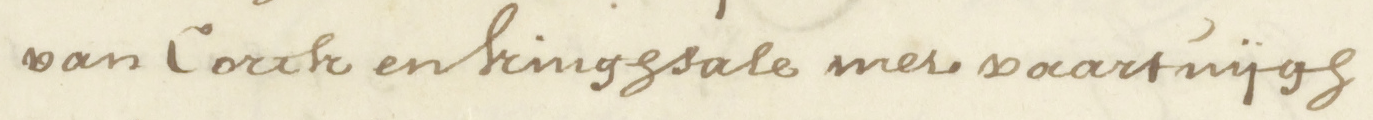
van Corck en kinghsale met vaartuijgh
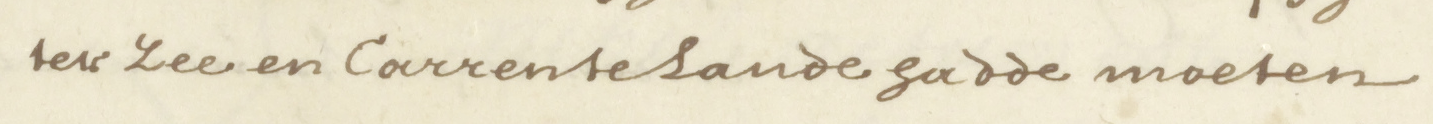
ter zee en Carren te lande hadde moeten
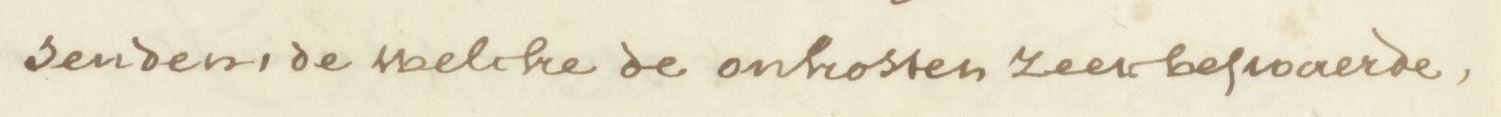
senden, de welcke de onkosten zeer beswaerde,
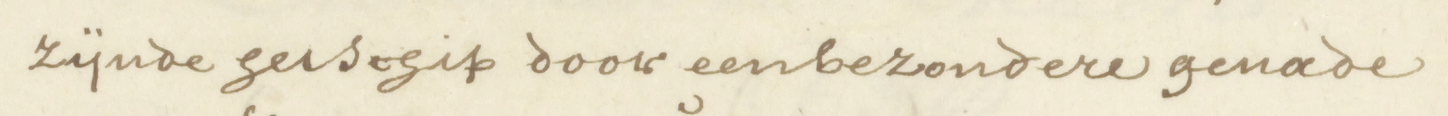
zijnde het schip door een bezondere genade
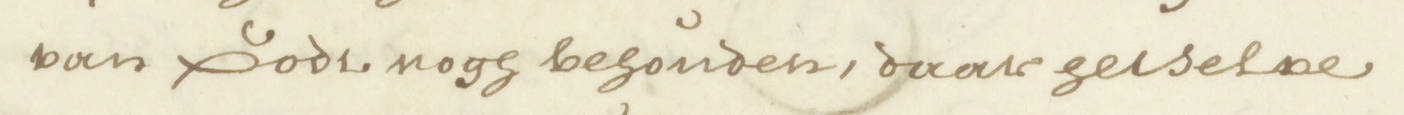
van Godt nogh behouden, daar hetselve
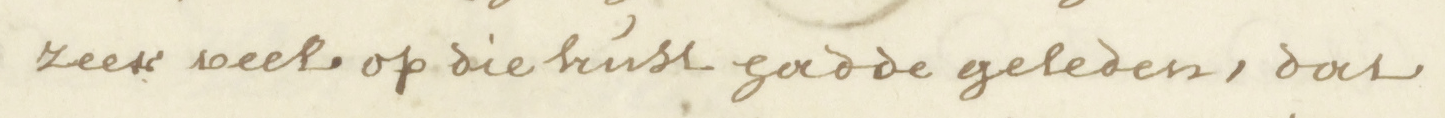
zeer veel op die kust hadde geleden, dat
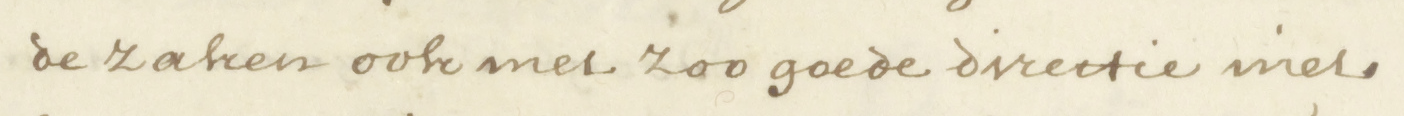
de zaken ook met zoo goede directie niet
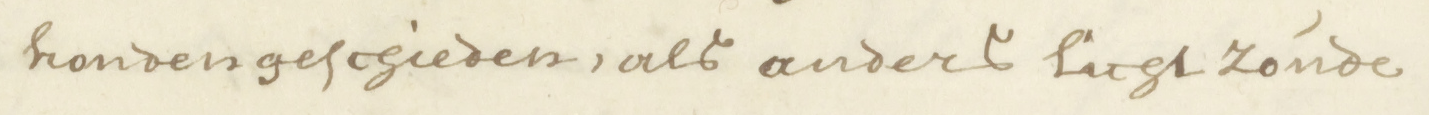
konden geschieden, als anders licht zoude
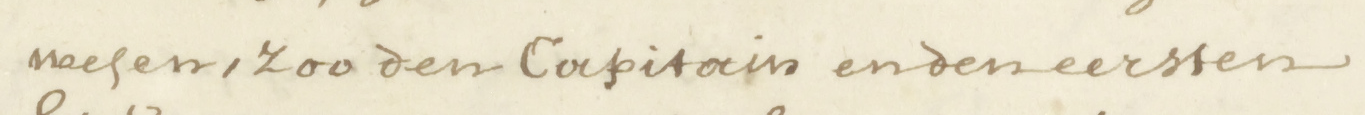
wesen, zoo den Capitain enden eersten
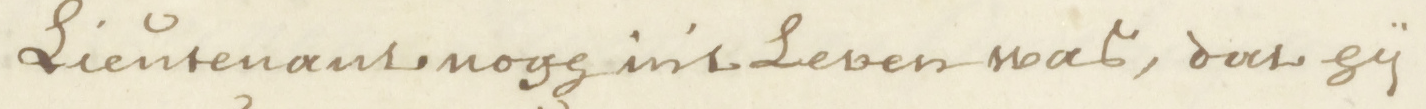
Lieutenant nogh in 't Leven was, dat hij
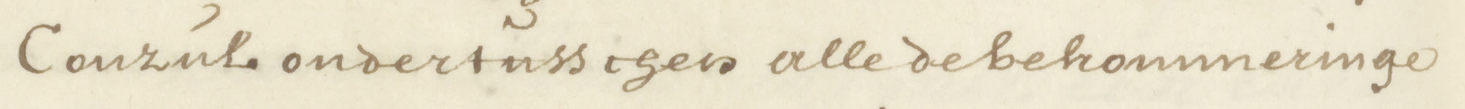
Conzul ondertusschen alle de bekommeringe
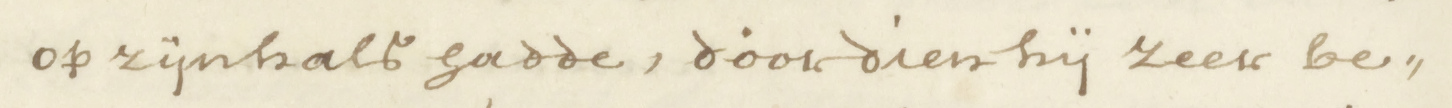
op zijn hals hadde, door dien hij zeer be,,
